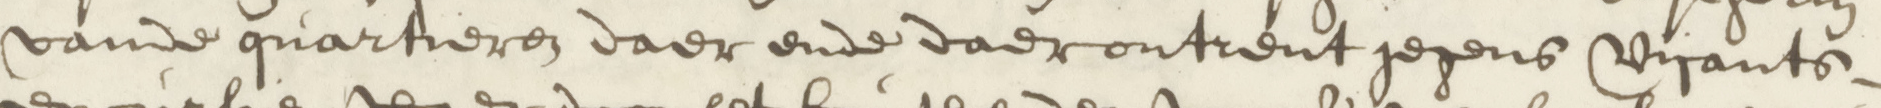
vande quartieren daer ende daerontrent jegens Vijants
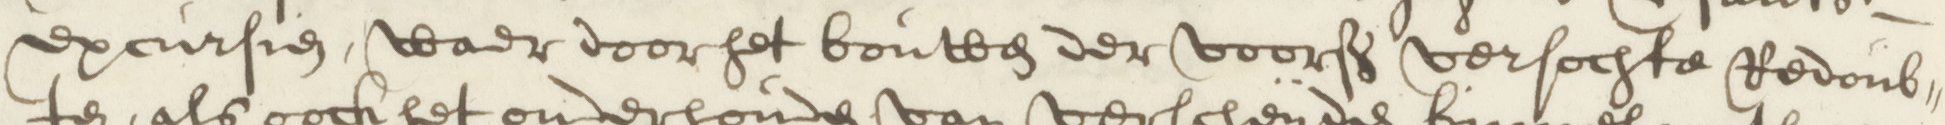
excursien, waer door het bouwen der voors versochte Redoub,,
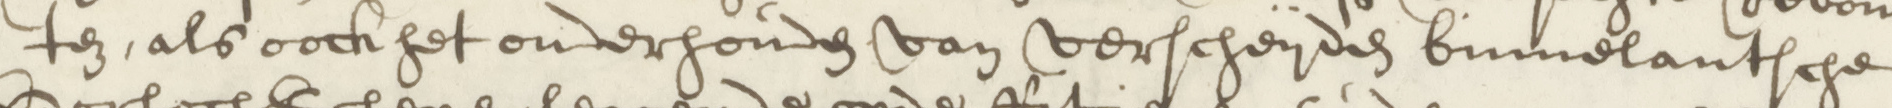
ten, als oock het onderhouden van verscheijden binnelantsche
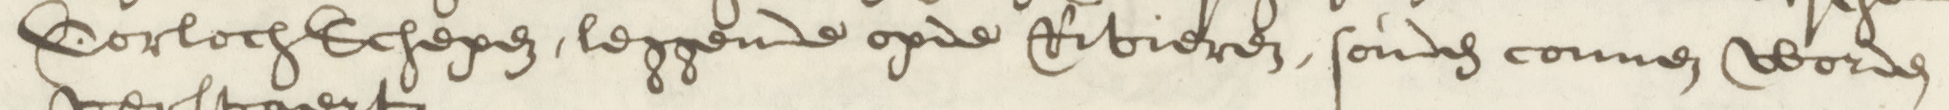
OorlochSchepen, leggende opde Rivieren, souden connen worden
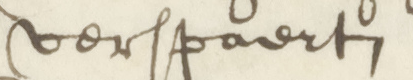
verspaert.
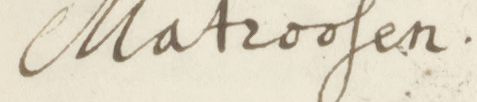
Matroosen.
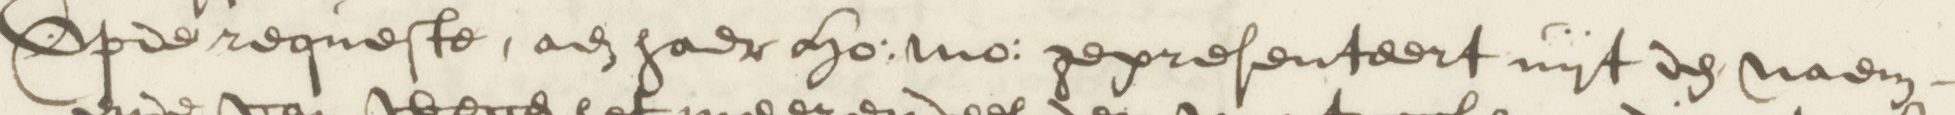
Opde requeste, aen haer Ho:Mo: gepresenteert uijt den naem
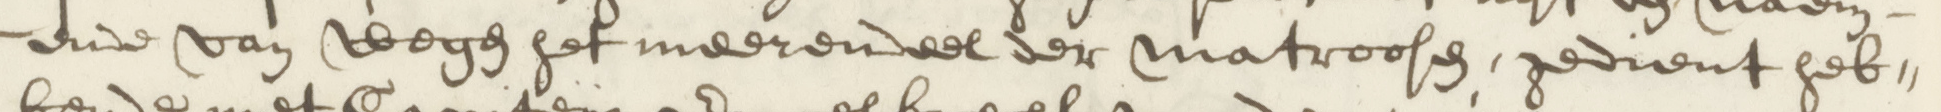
ende van wegen het meerendeel der matroosen, gedient heb„
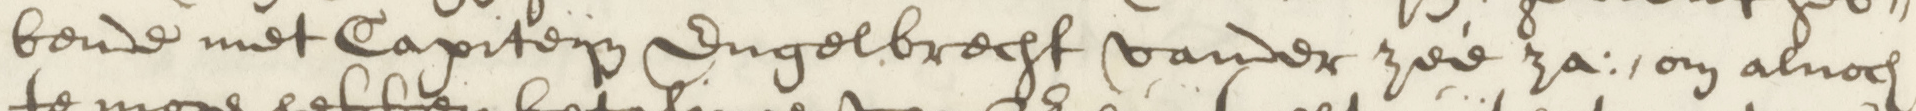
bende met Capiteijn Engelbrecht vander zee za:, om alnoch
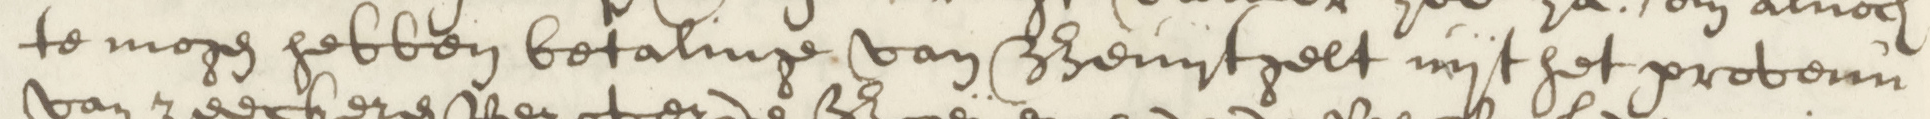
te mogen hebben betalinge van Beuijtgelt uijt het provenu
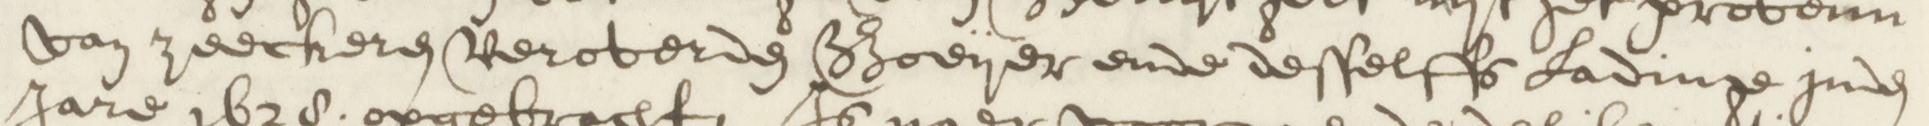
van zeeckeren Veroverden Boeijer ende desselffs Ladinge inden
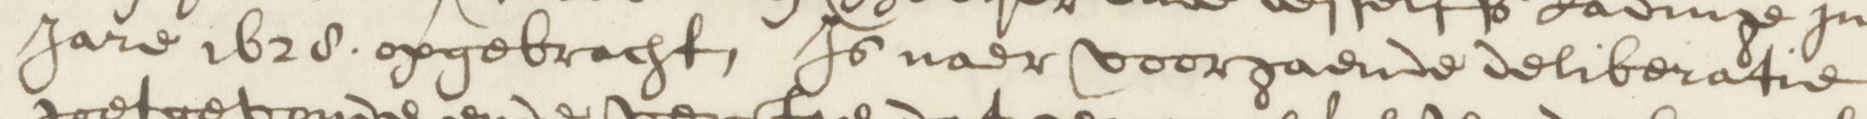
Jare 1628. opgebracht, Is naer voorgaende deliberatie
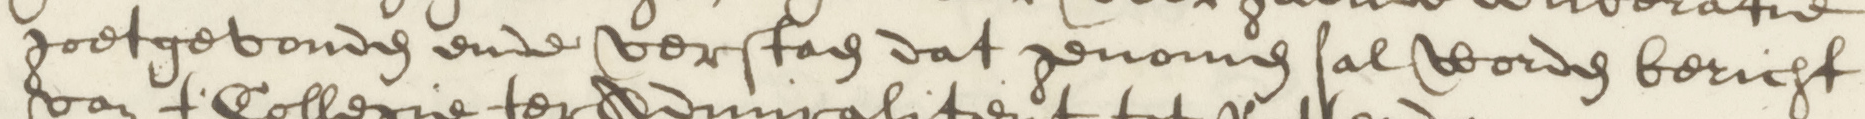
goetgevonden ende verstaen dat genomen sal worden bericht
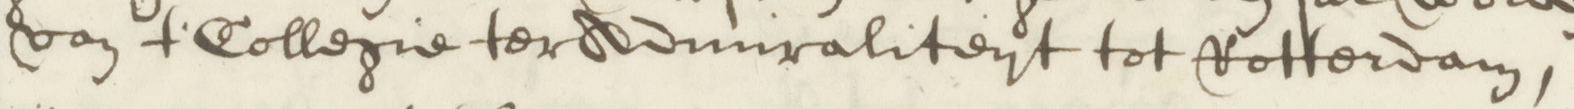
van t'Collegie ter Admiraliteijt tot Rotterdam,
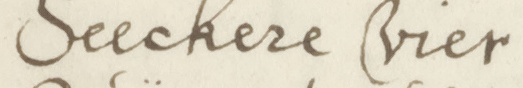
Seeckere vier
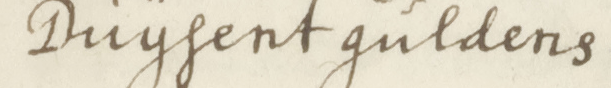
Duijsent guldens
